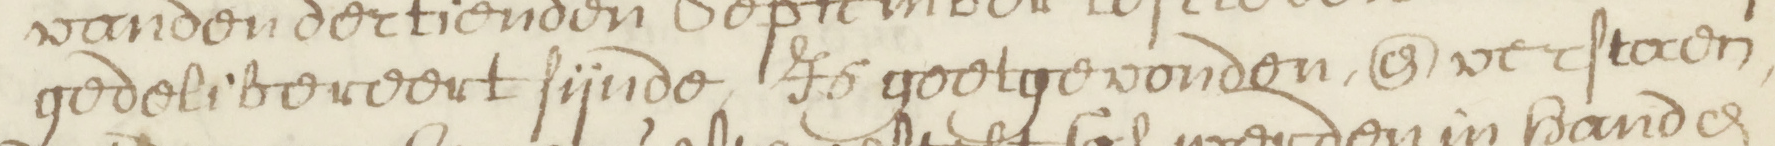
gedelibereert sijnde, Is goetgevonden, & verstaen,
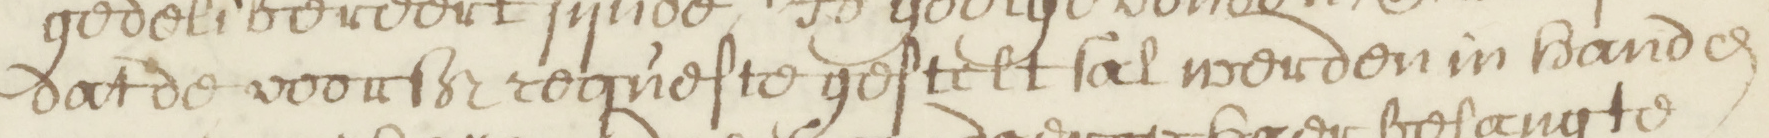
dat de voors. requeste gestelt sal werden in handen
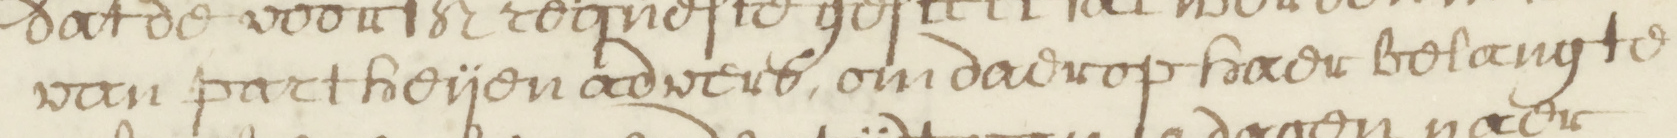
van partheijen advers, om daerop haer belang te
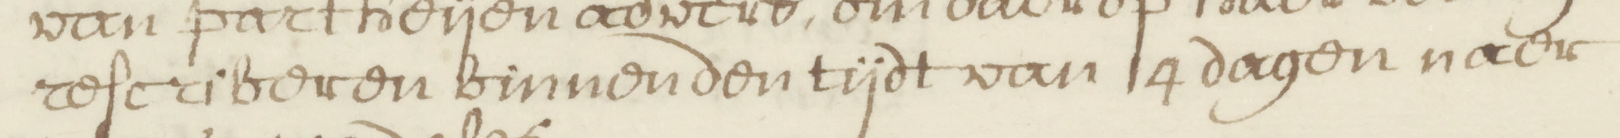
rescriberen binnen den tijdt van 14dagen naer
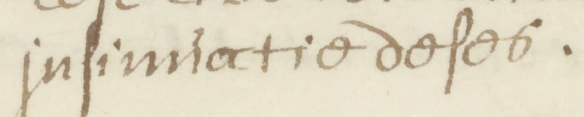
insinuatie deses.
